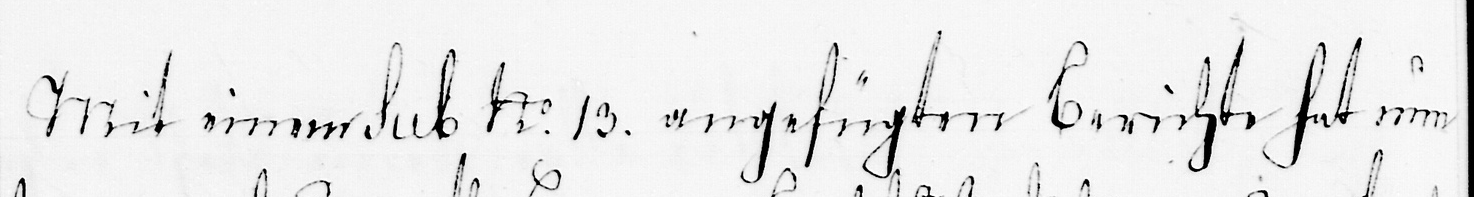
Mit einem sub No. 13. angefügten Berichte hat nun
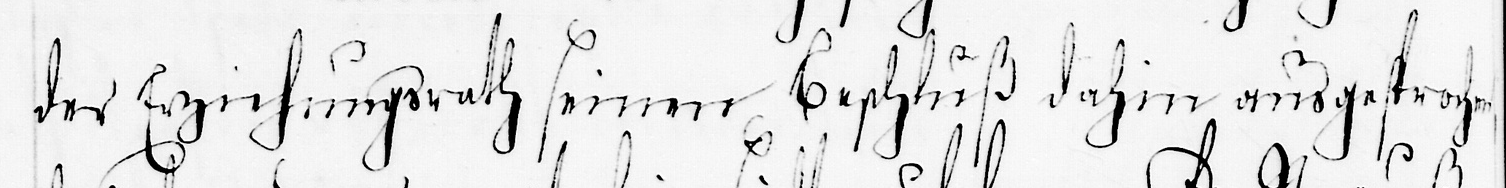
der Erziehungsrath seinen Beschluß dahin ausgesproc¬
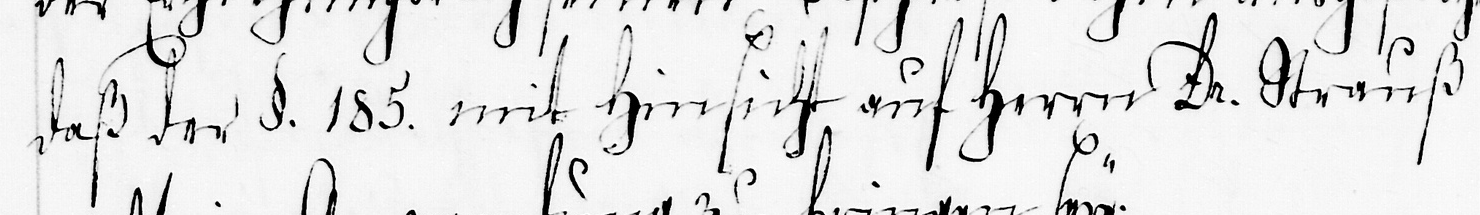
daß der §. 185. mit Hinsicht auf Herrn Dr. Strauß
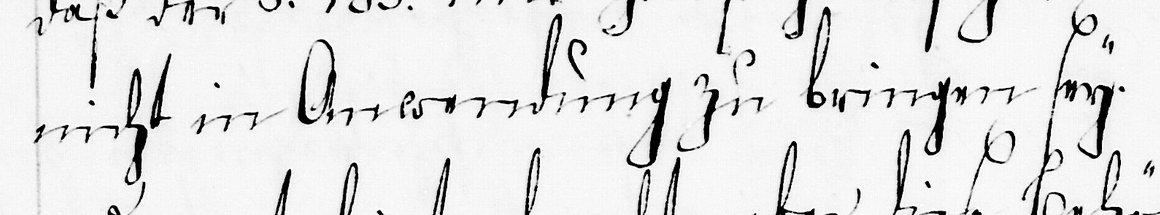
nicht in Anwendung zu bringen sey.
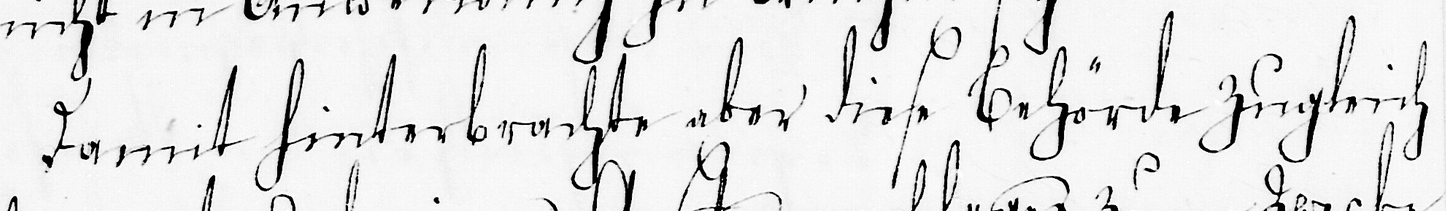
Damit hinterbrachte aber diese Behörde zugleich
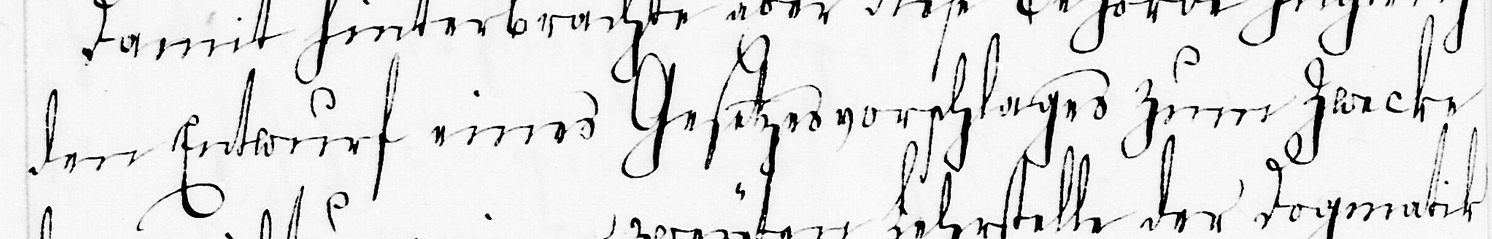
den Entwurf eines Gesetzesvorschlages zum Zwecke
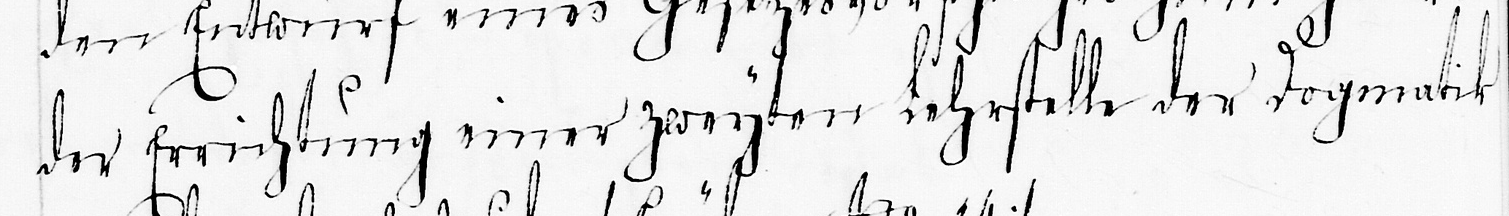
der Errichtung einer zweyten Lehrstelle der Dogmatik
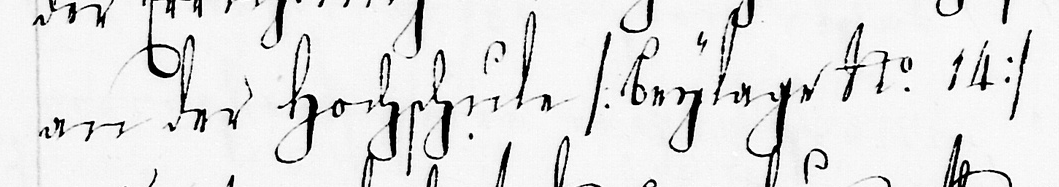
an der Hochschule [Beylage No. 14]
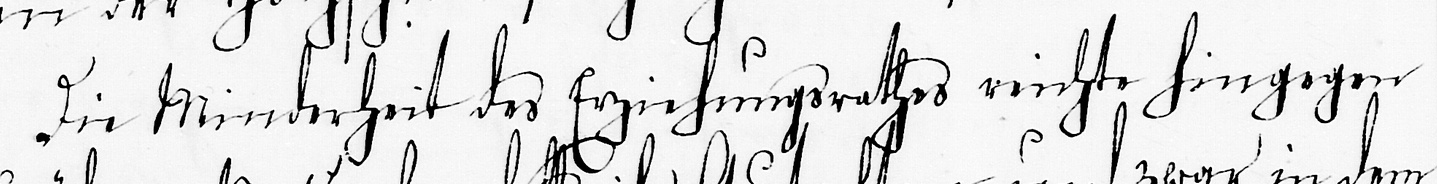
Die Minderheit des Erziehungsrathes reichte hingegen
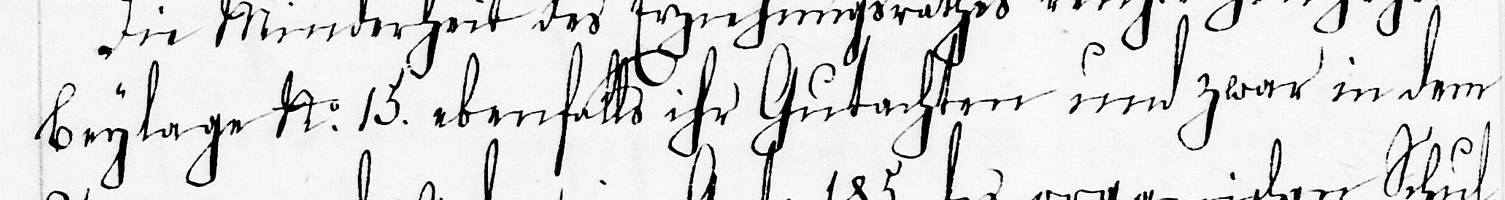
Beylage No. 15. ebenfalls ihr Gutachten und zwar in dem
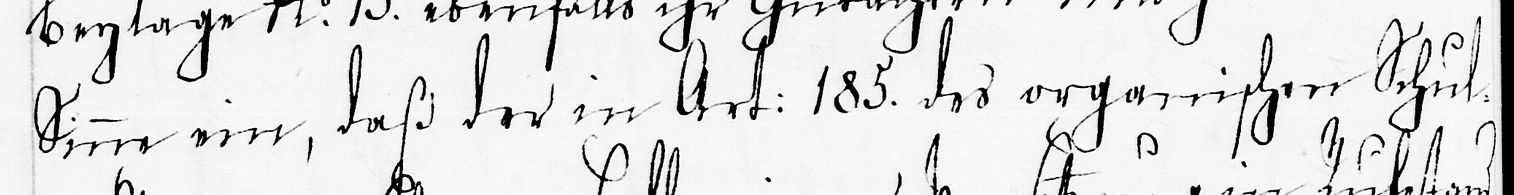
Sinne ein, daß der in Art: 185. des organischen Schul¬
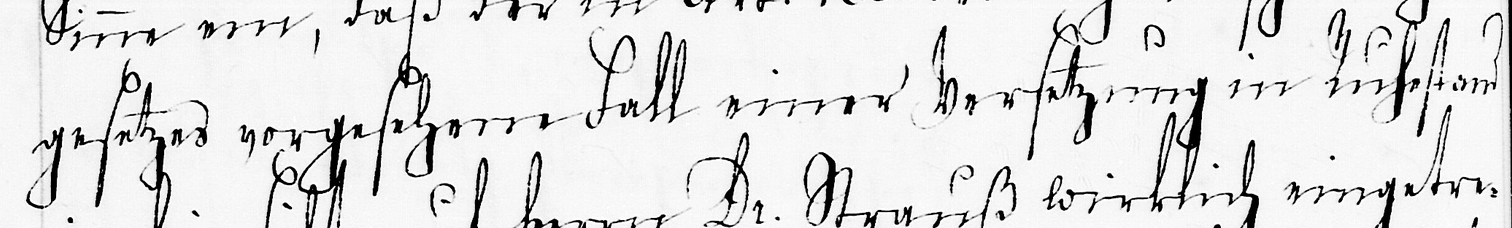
gesetzes vorgesehene Fall einer Versetzung in Ruhesta¬
